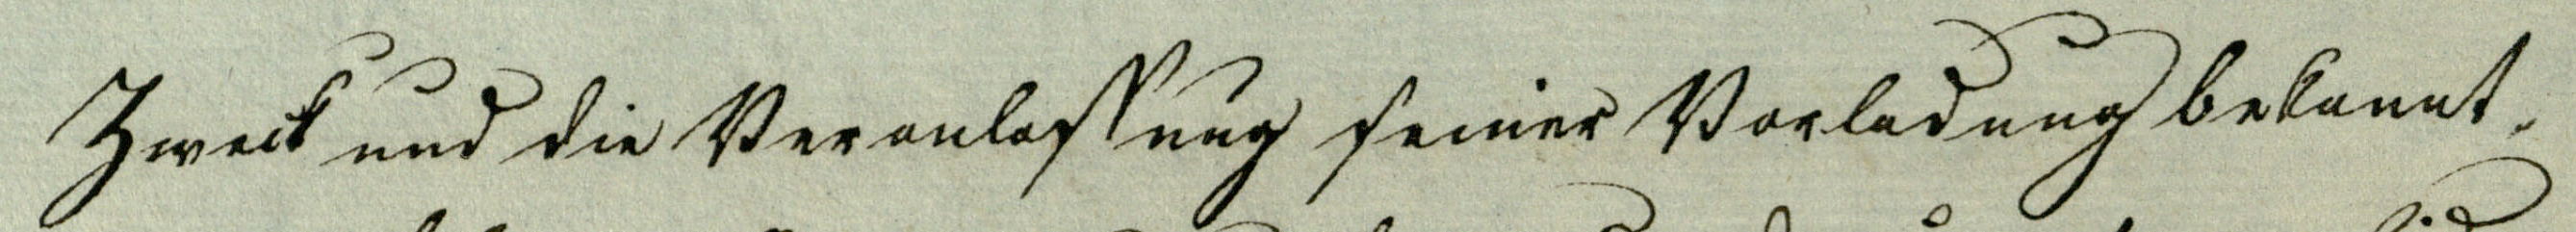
Zweck und die Veranlassung seiner Vorladung bekannt,
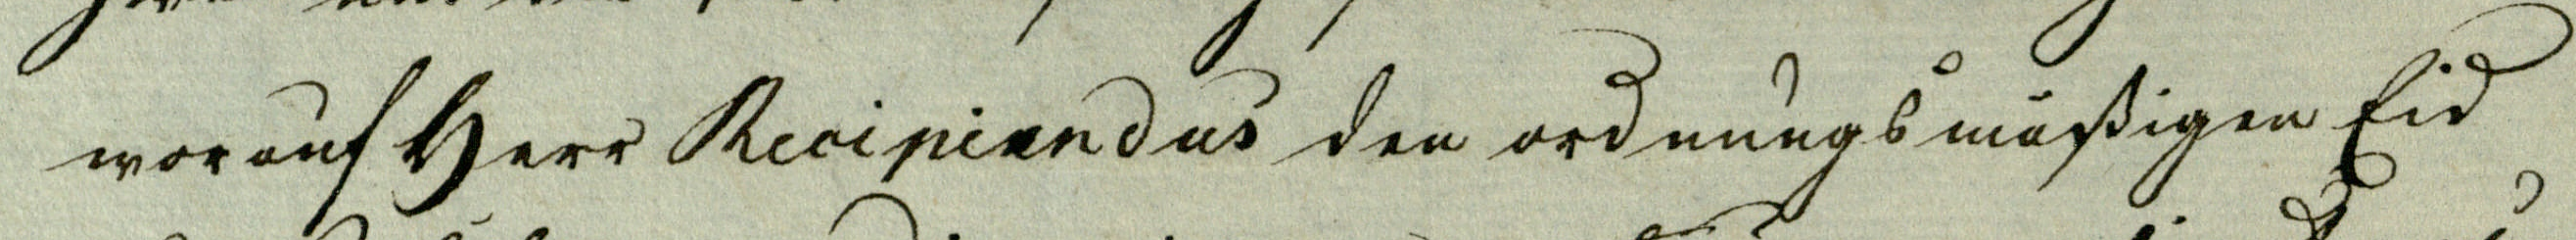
worauf Herr Recipiandus den ordnungsmäßigen Eid
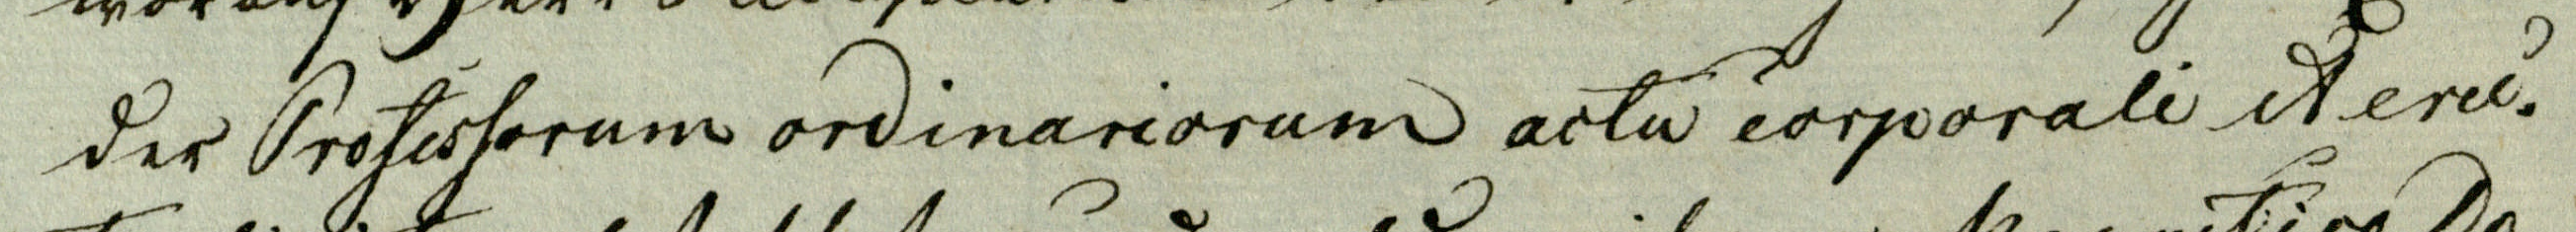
der Professorum ordinariorum actu corporali et eru¬
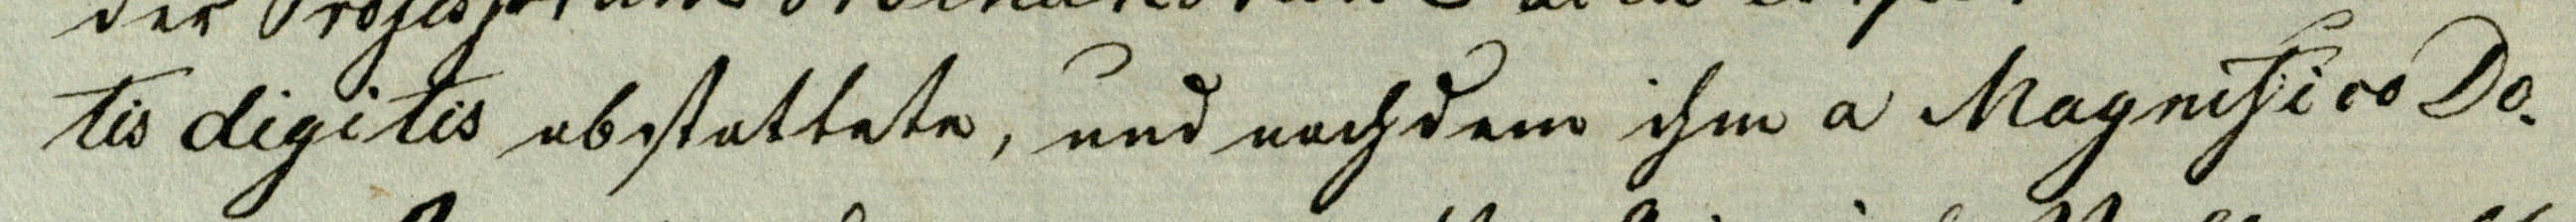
tis digitis abstattete, und nachdem ihm a Magnifico Do¬
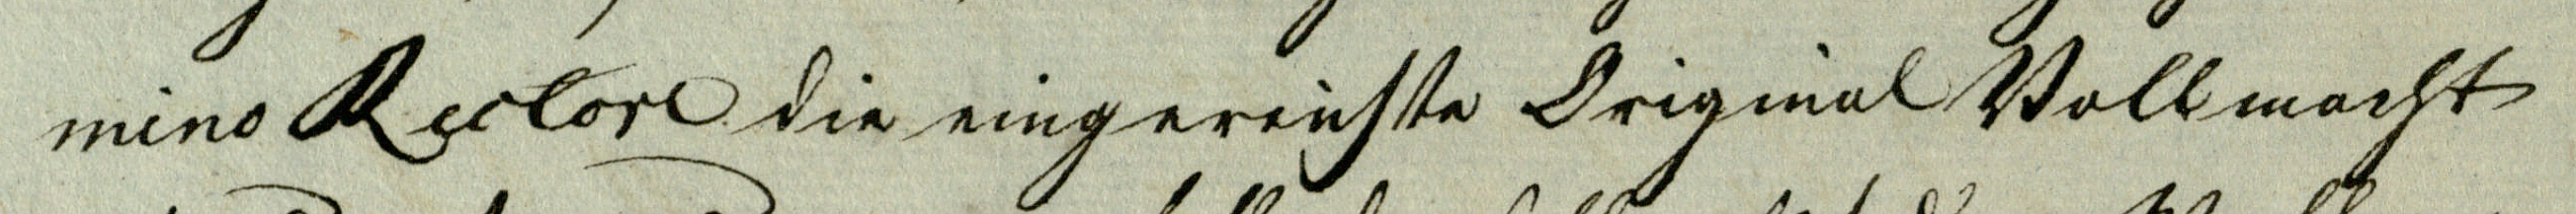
mino Rector die eingereichte Original Vollmacht
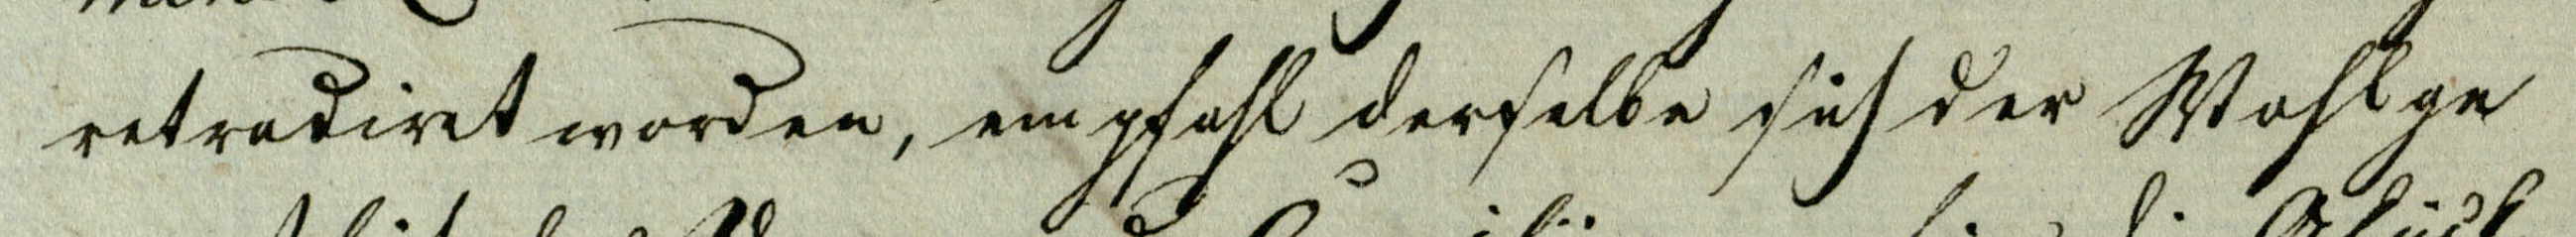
retradiret worden, empfahl derselbe sich der Wohlge¬
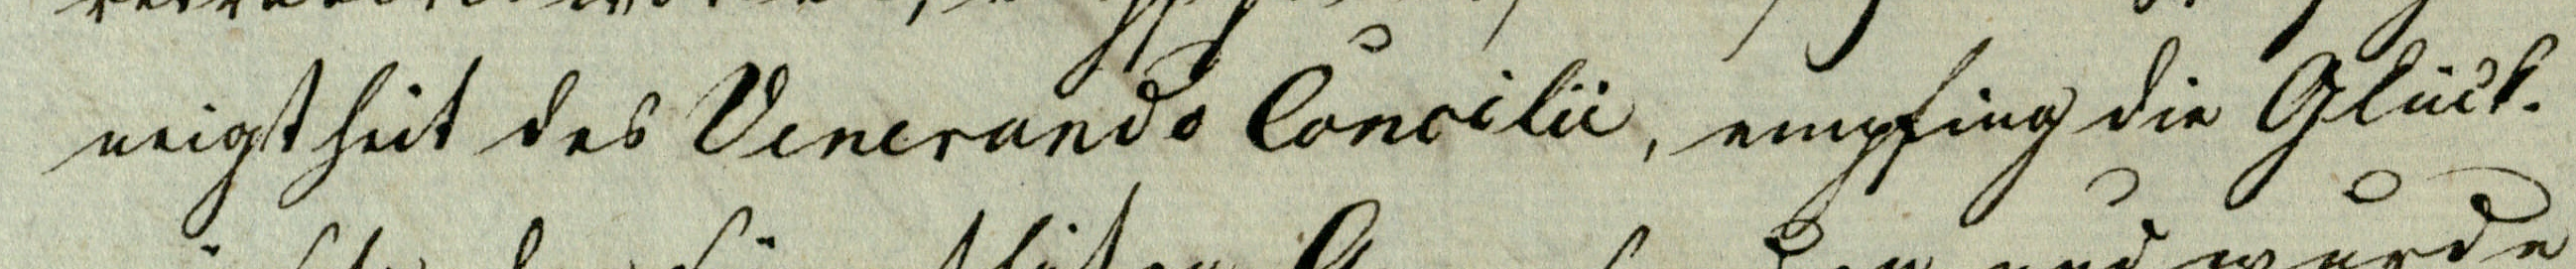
neigtheit des Venerando Concilii, empfing die Glück¬
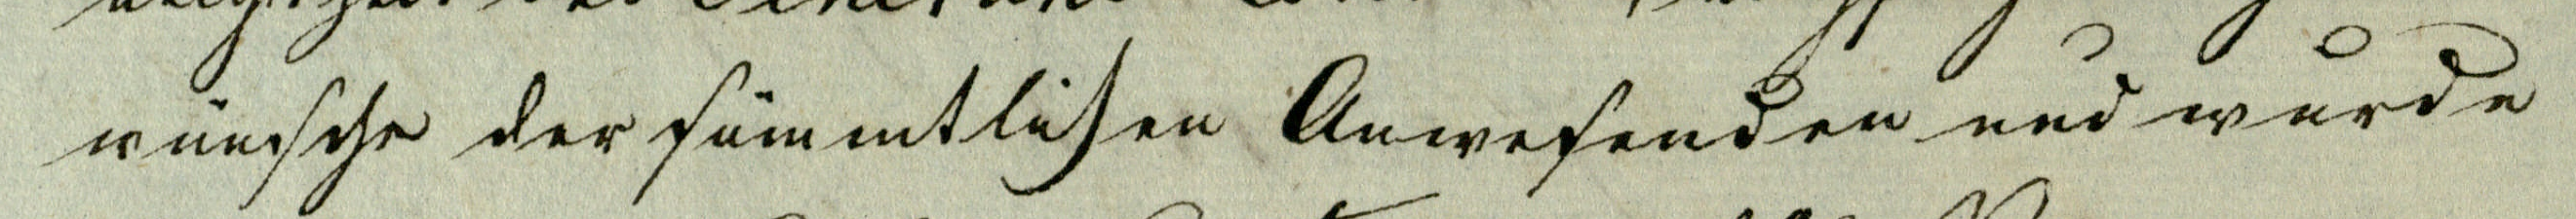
wünsche der sämmtlichen Anwesenden und wurde
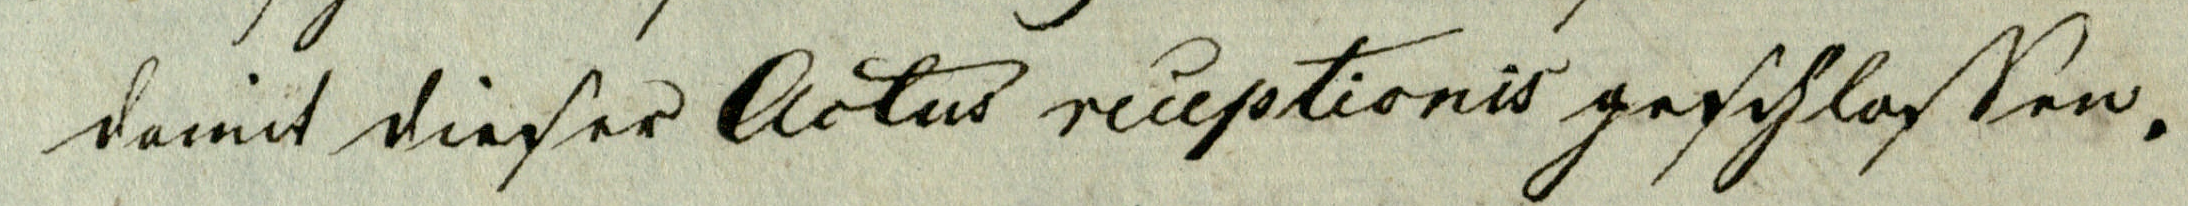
damit dieser Actus receptionis geschlossen.
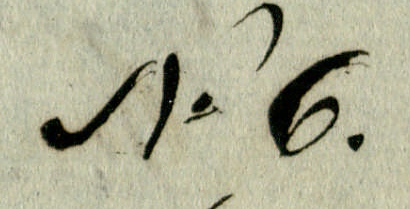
Nº 6.
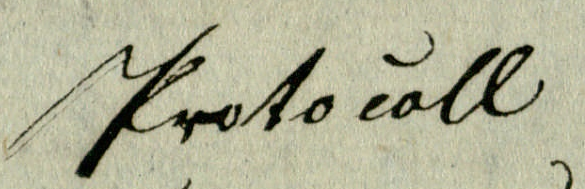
Protocoll
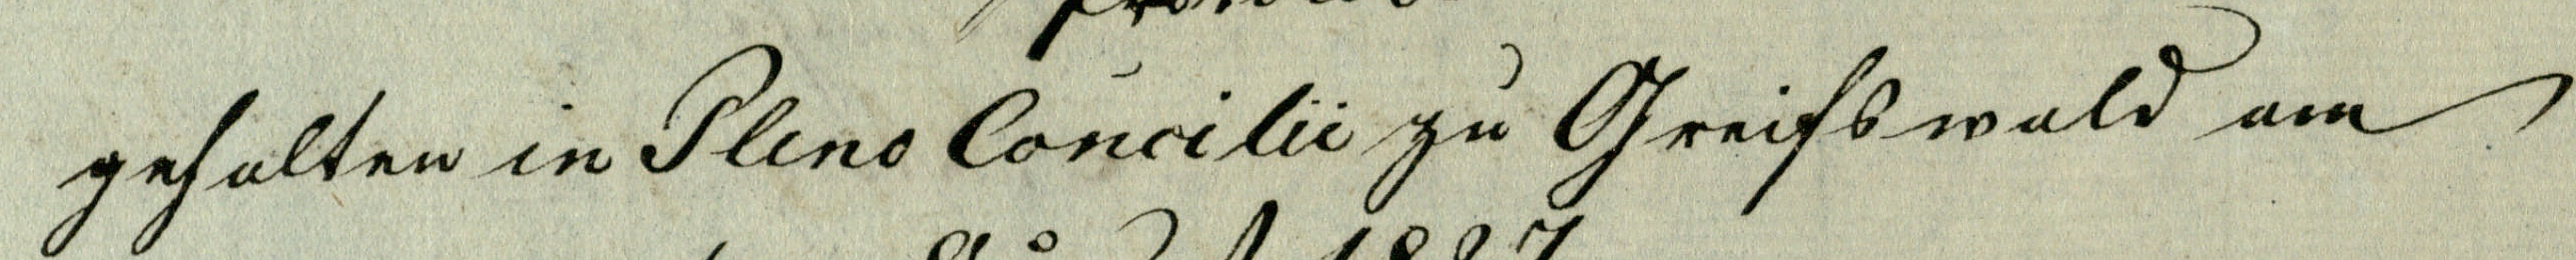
gehalten in Pleno Concilii zu Greifswald am
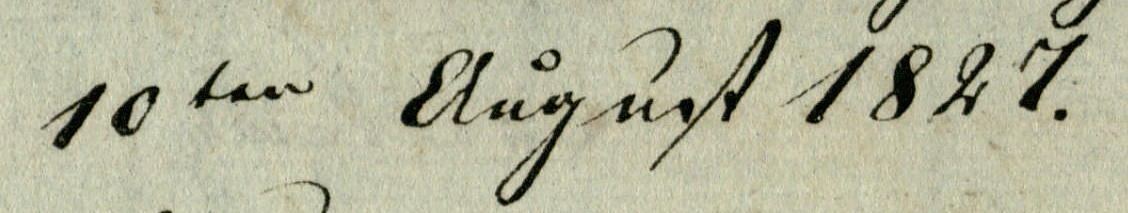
10ten August 1827.
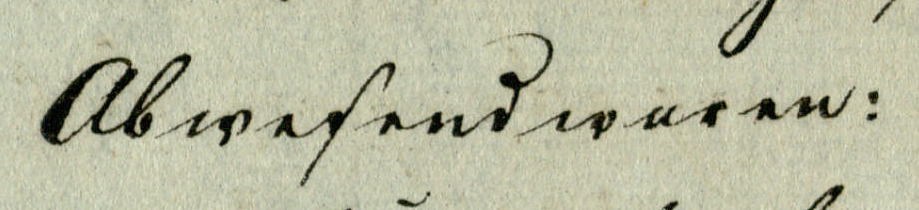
Abwesend waren:
